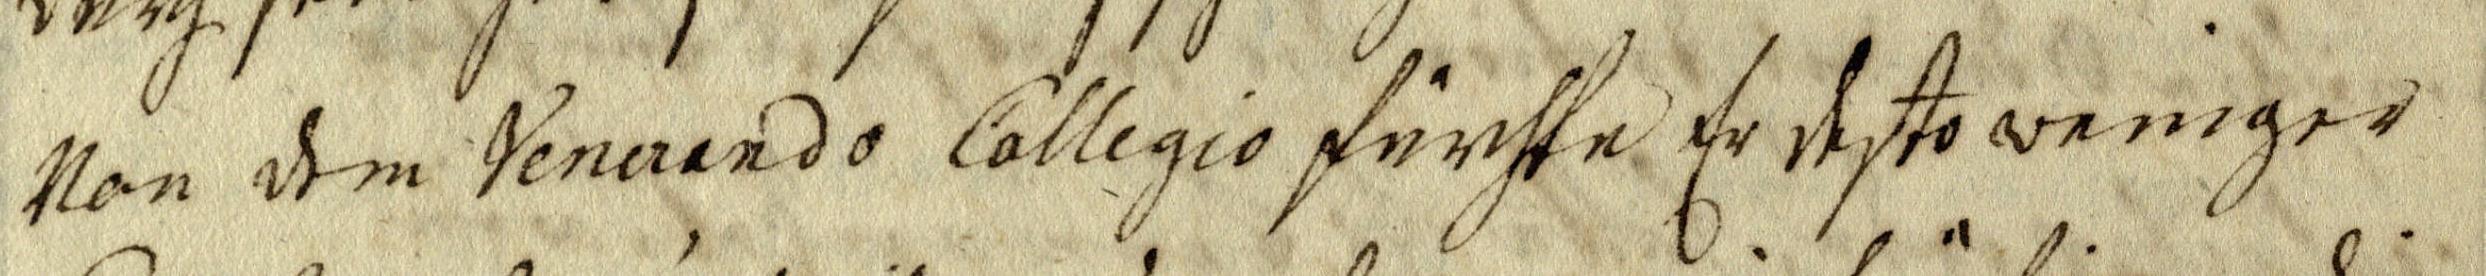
Von dem Venerando Collegio fürchte Er desto weniger
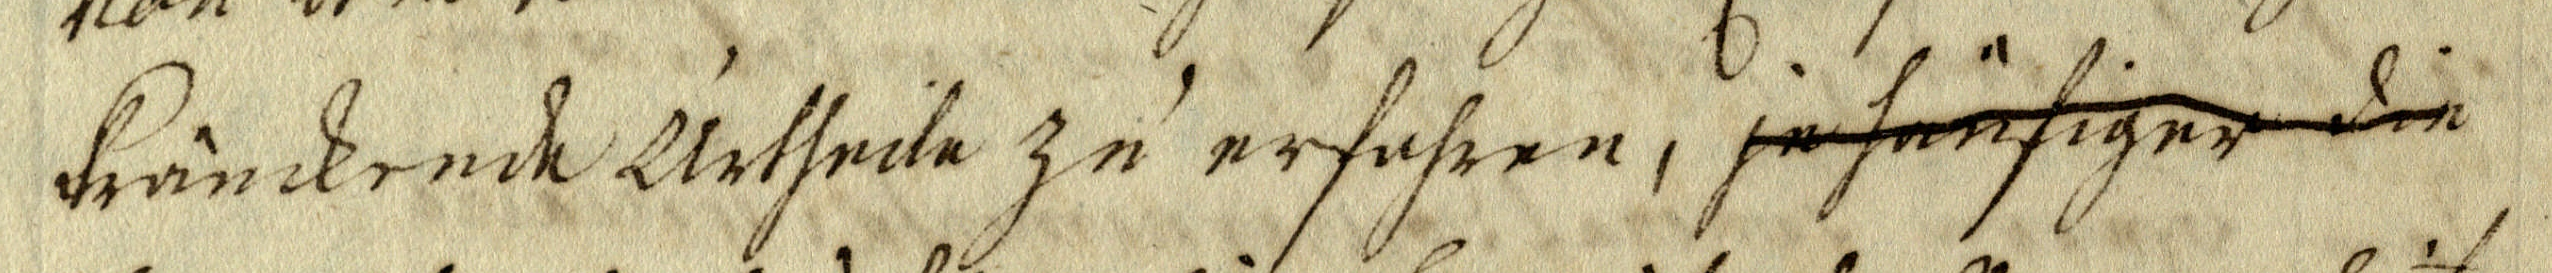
Kränckende Urtheile zu erfahren,
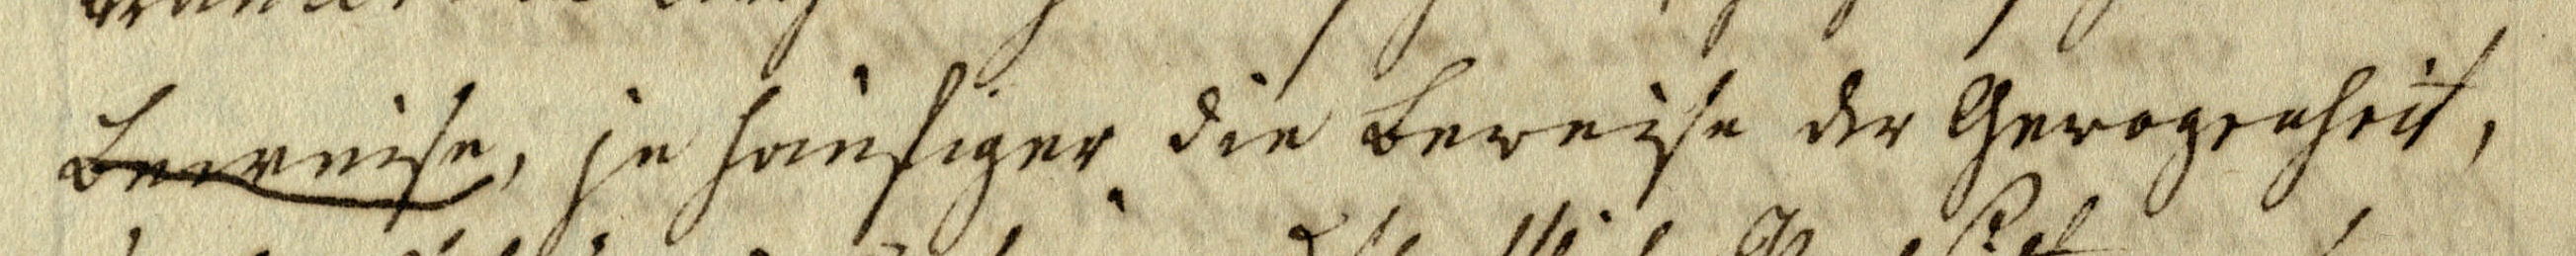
je häufiger die Beweise der Gewogenheit,
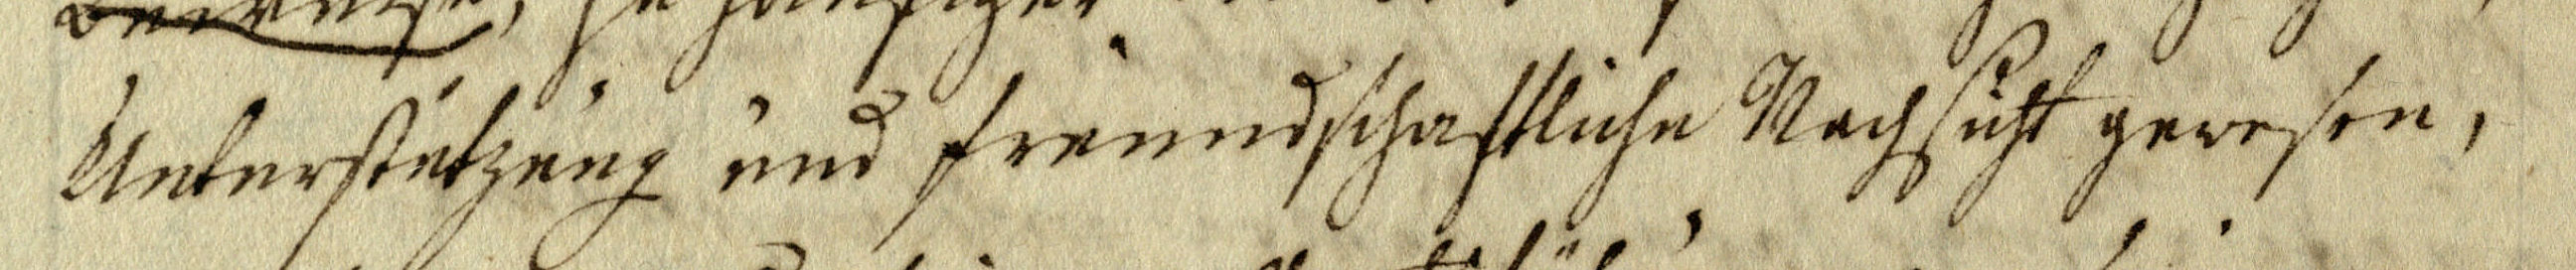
Unterstützung und freundschaftliche Nachsicht gewesen,
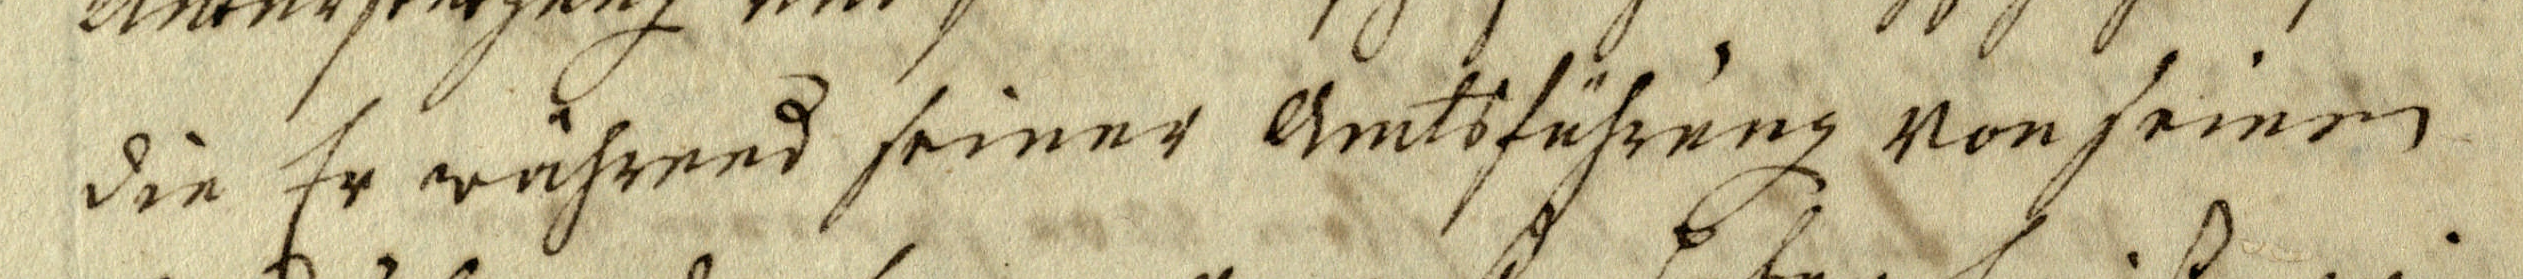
die Er während seiner Amtsführung von seinen
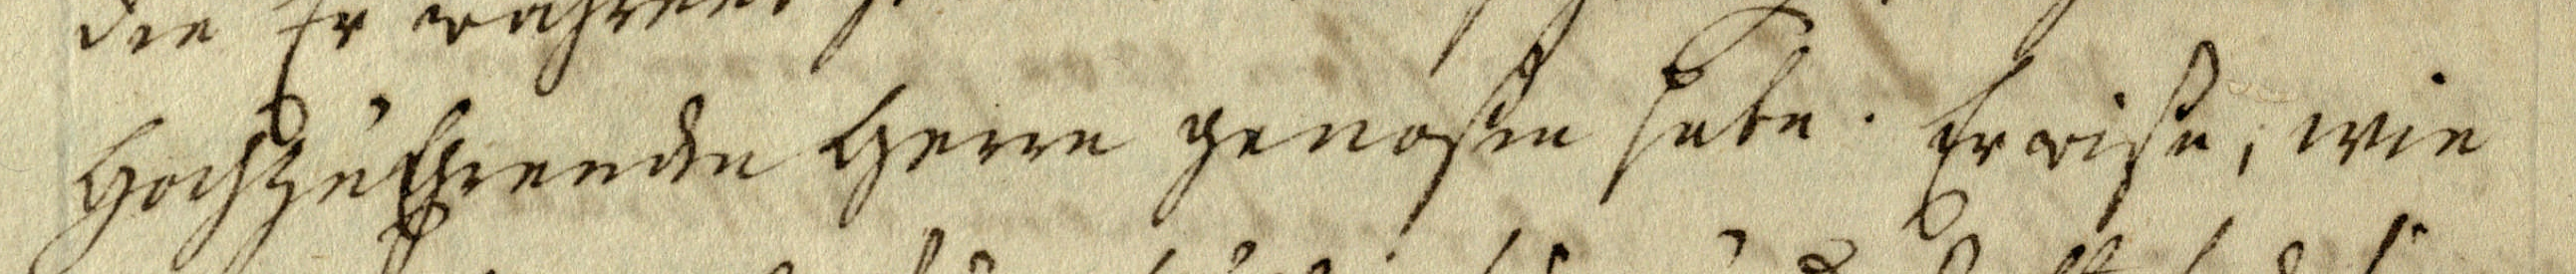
Hochzuehrenden Herrn genoßen habe. Er wiße, wie
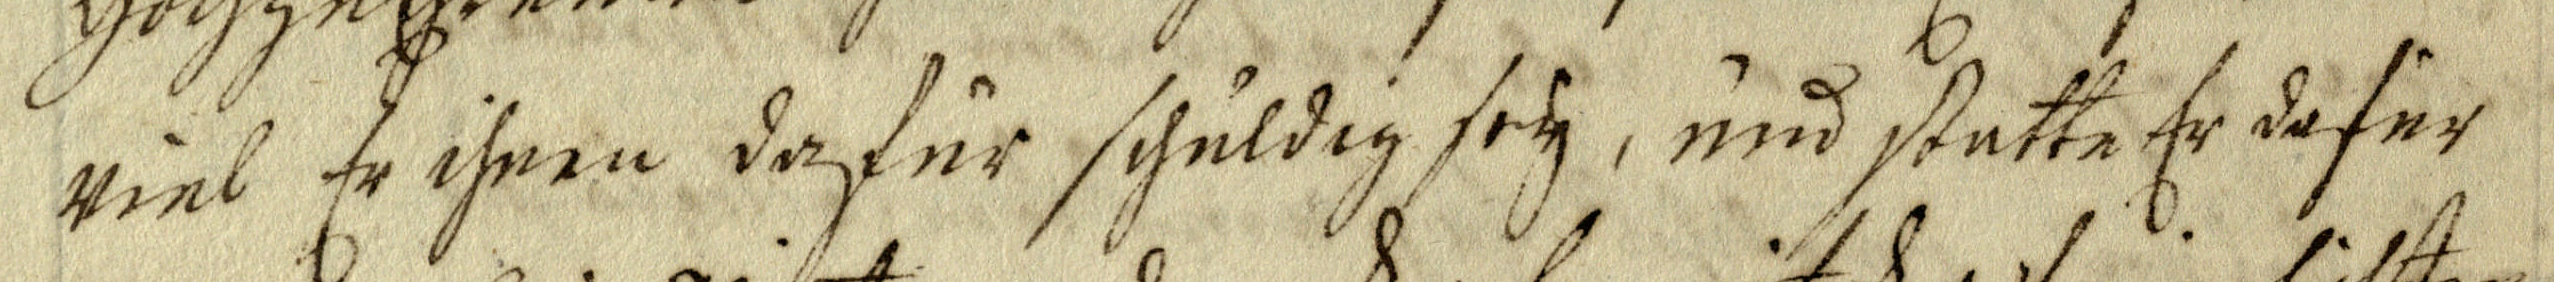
viel Er ihnen dafür schuldig seÿ, und statte Er dafür
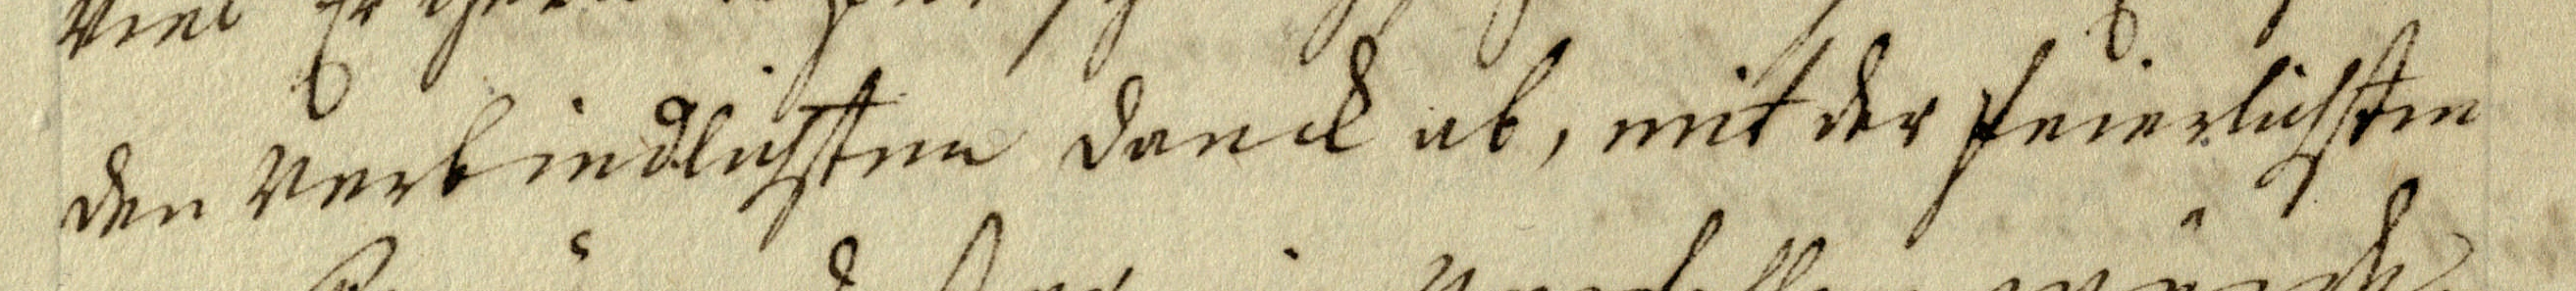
den verbindlichsten Danck ab, mit der feierlichsten
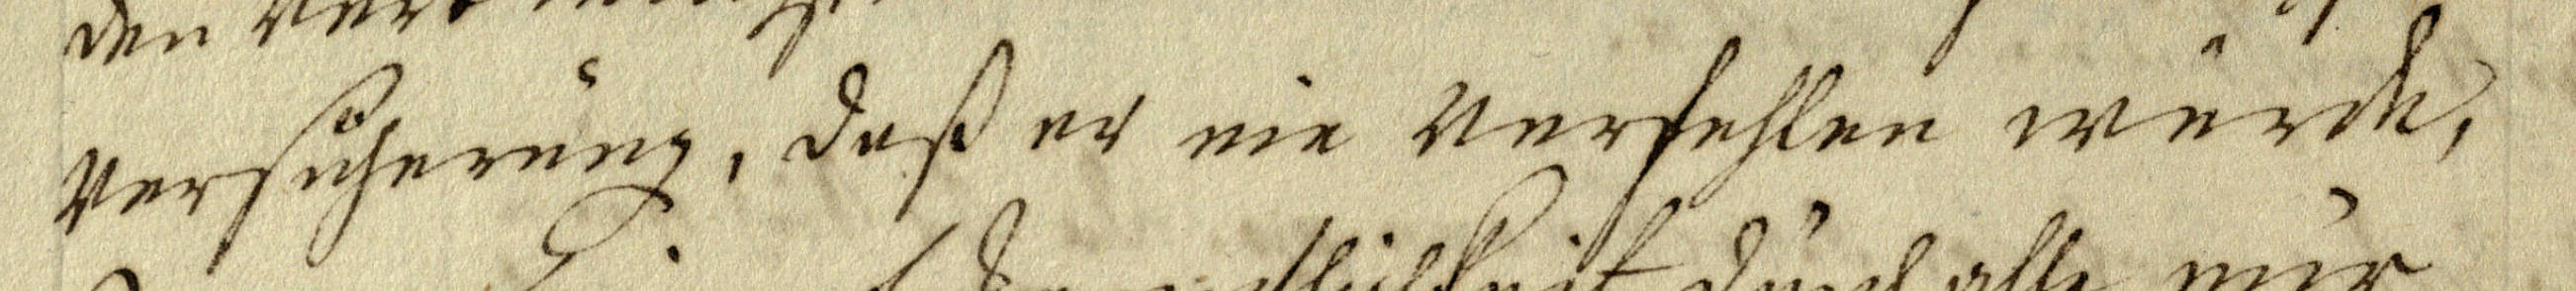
Versicherung, daß er nie verfehlen würde,
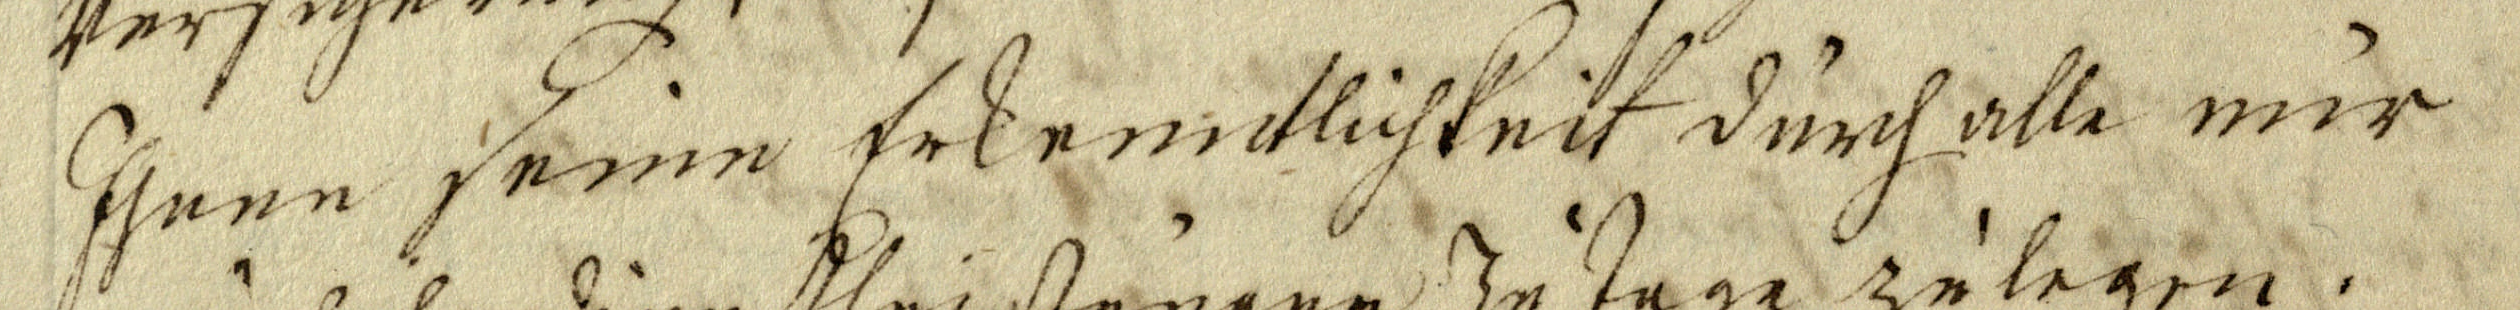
Ihnen seine Erkenntlichkeit durch alle nur
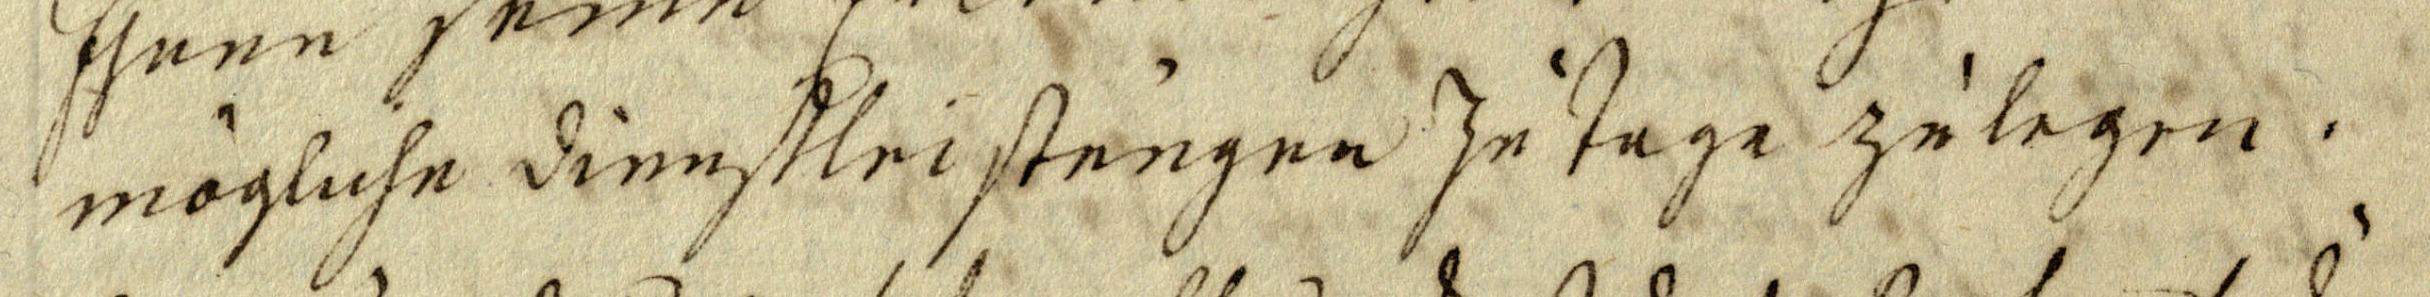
mögliche Dienstleistungen zu Tage zu legen.
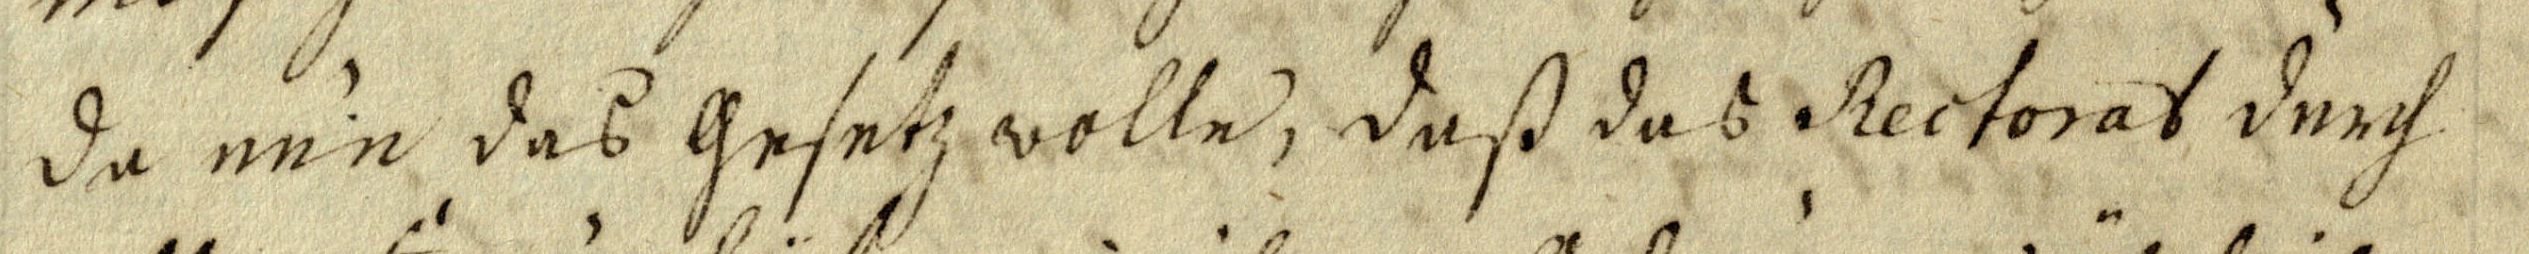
Da nun das Gesetz wolle, daß das Rectorat durch
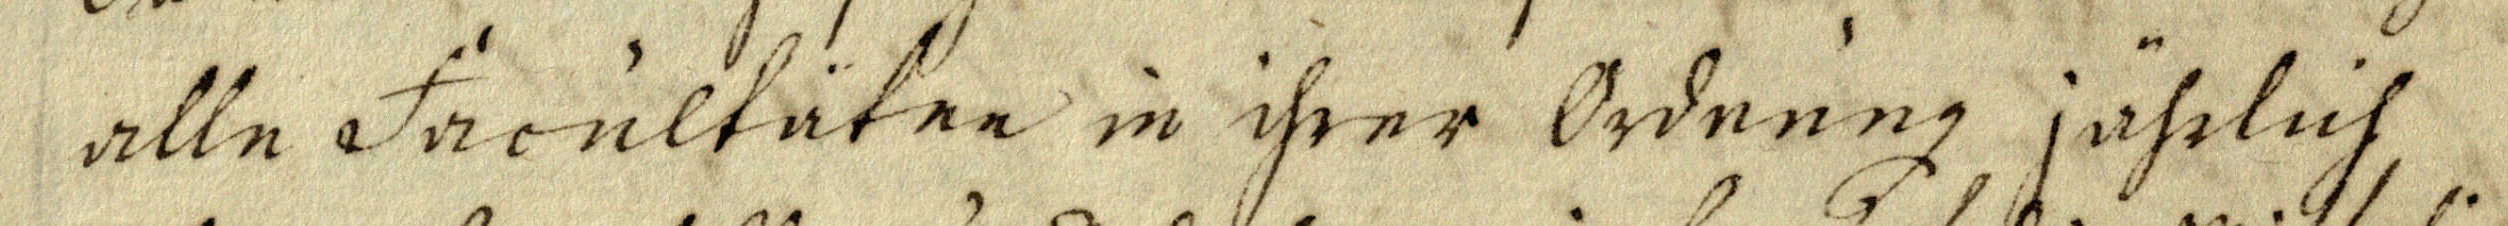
alle Facultäten in ihrer Ordnung jährlich
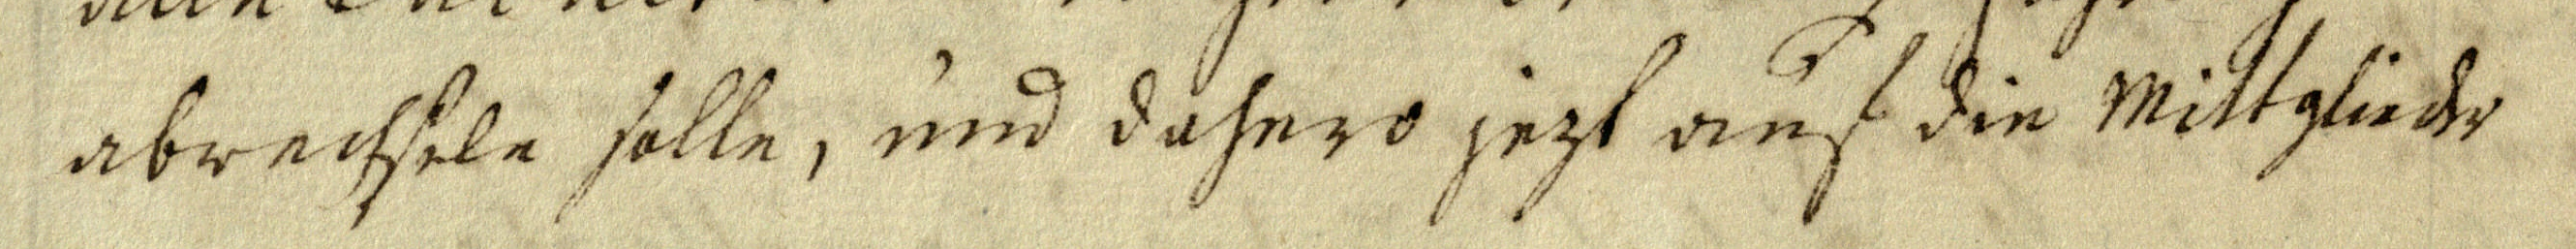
abwechseln solle, und dahero jezt auf die Mittglieder
